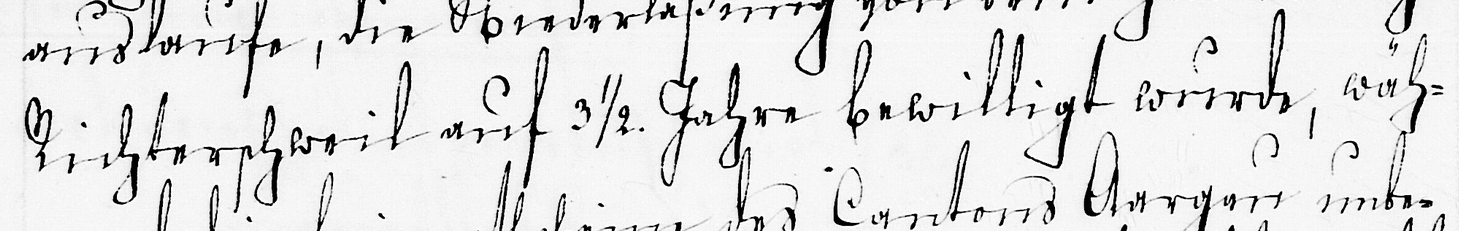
Richterschweil auf 3½. Jahre bewilligt wurde, wäh¬
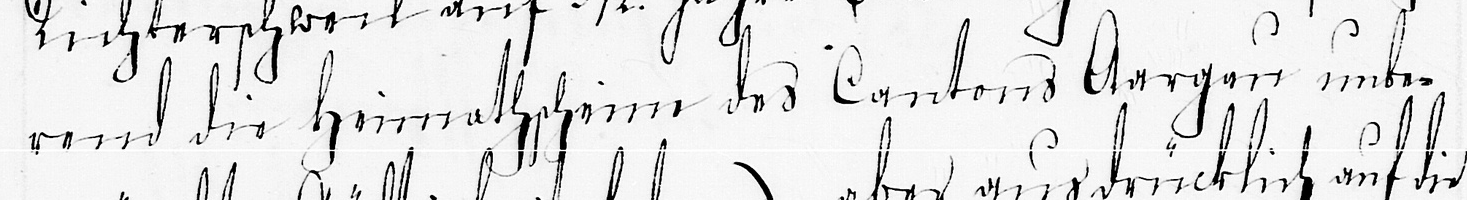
rend die Heimathscheine des Cantons Aargau unbe¬
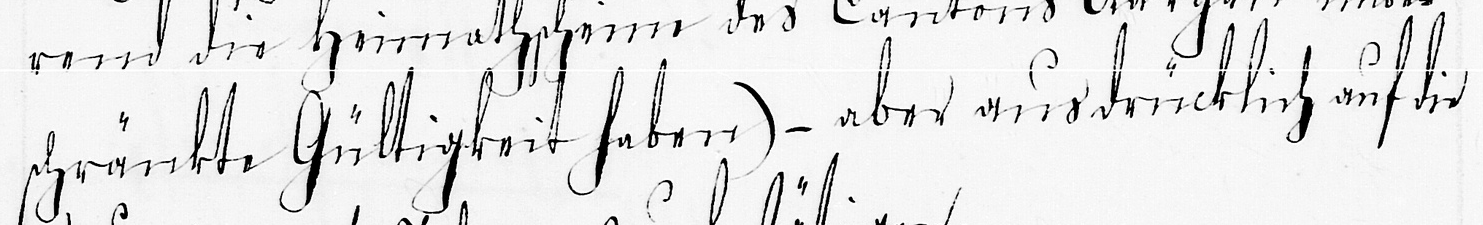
schränkte Gültigkeit haben) – aber ausdrücklich auf die
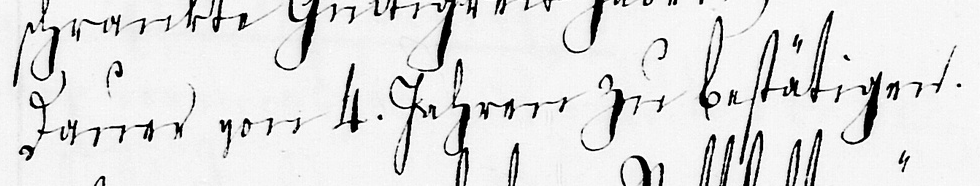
Dauer von 4. Jahren zu bestätigen.
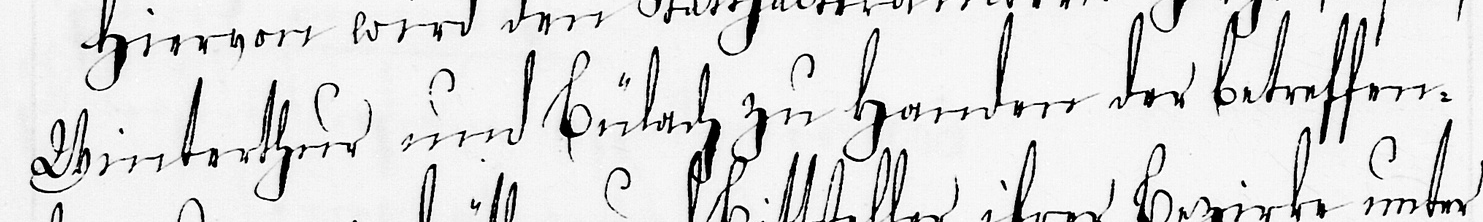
Winterthur und Bülach zu Handen der betreffen¬
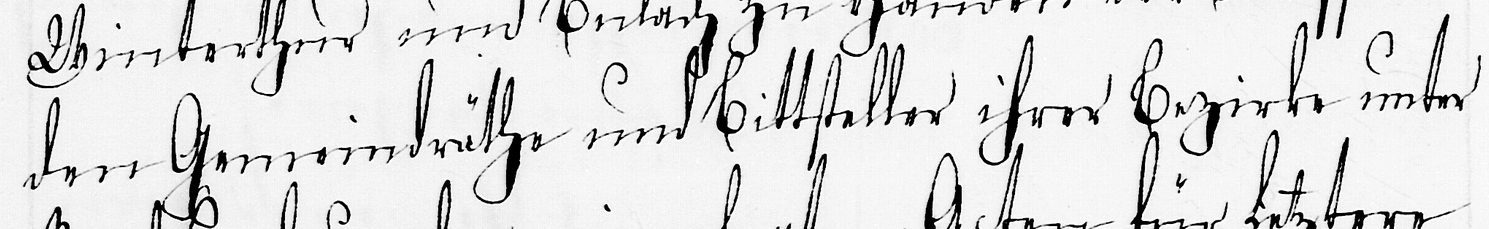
den Gemeindräthe und Bittsteller ihrer Bezirke unter
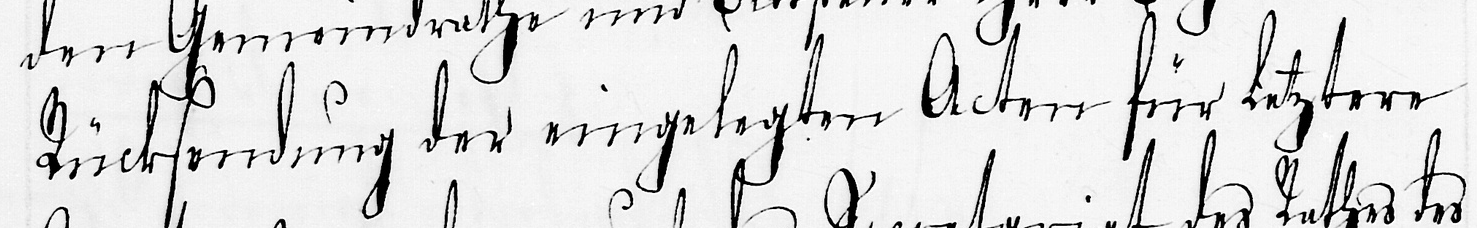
Rücksendung der eingelegten Acten für Letztere
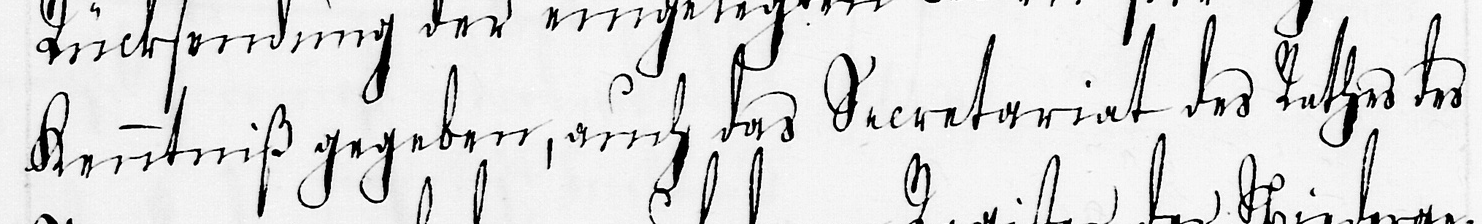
Kenntniß gegeben, auch das Secretariat des Rathes des
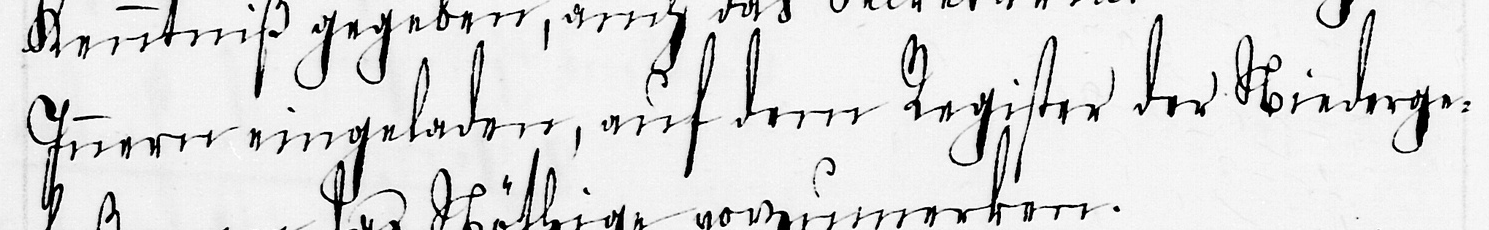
Innern eingeladen, auf dem Register der Niederge¬
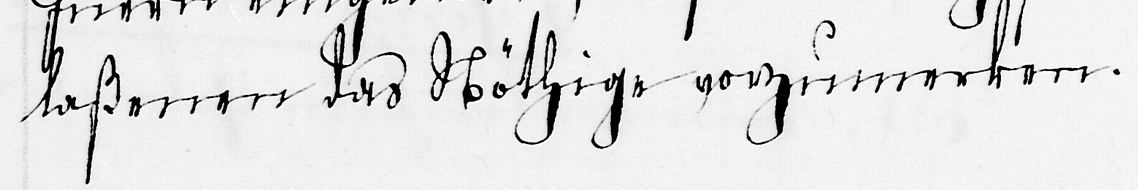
laßenen das Nöthige vorzumerken.
